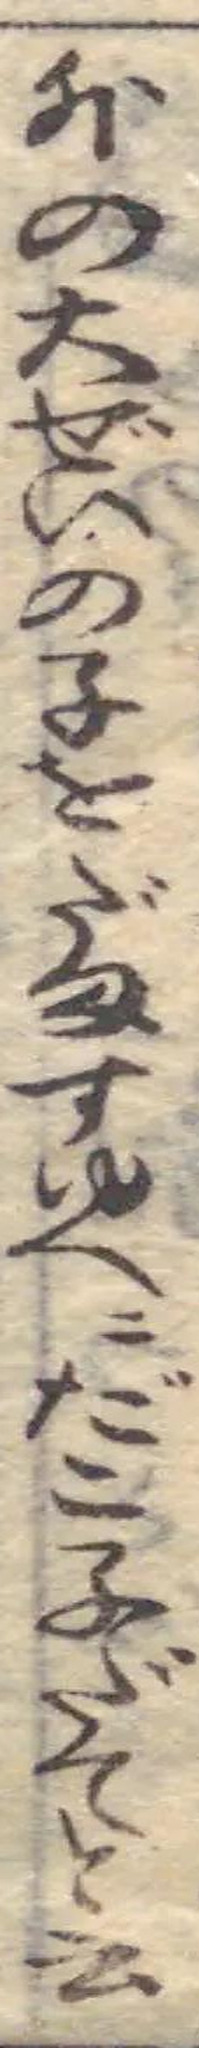外の大ぜいの子をだますゆへにだこ子だてと云
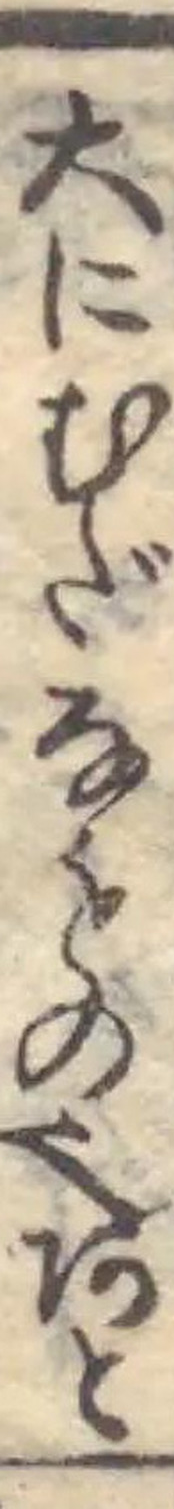大にむだなもの也あと
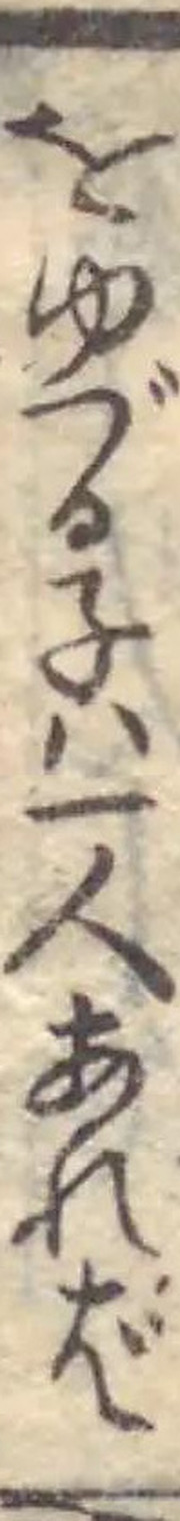をゆづる子は一人あれば
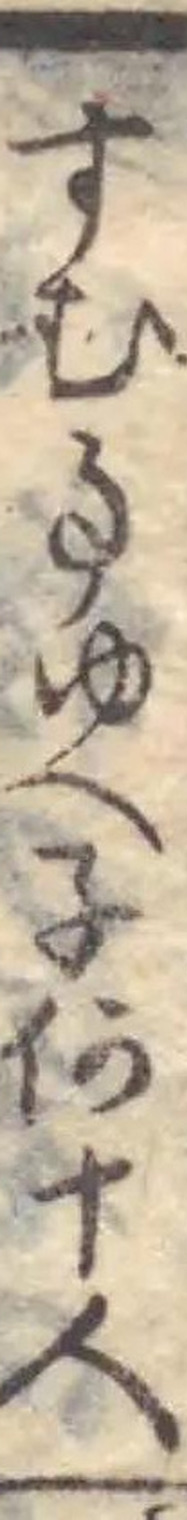すむ事ゆへ子何十人
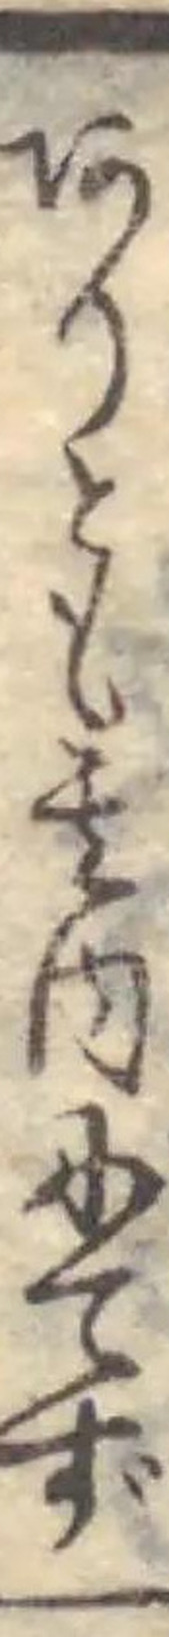ありとも其打ちにてず
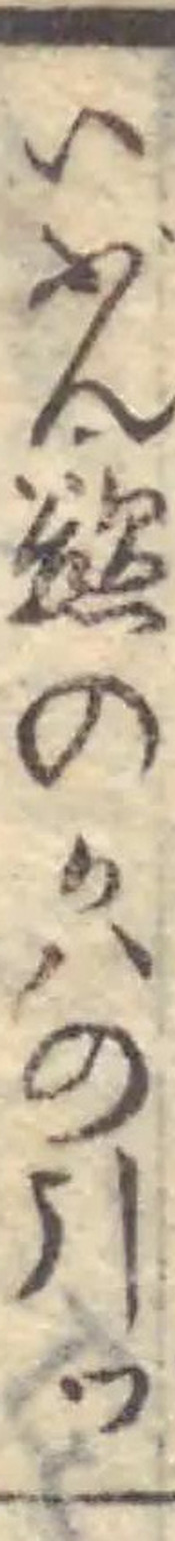いぶん欲のかはの引ッ
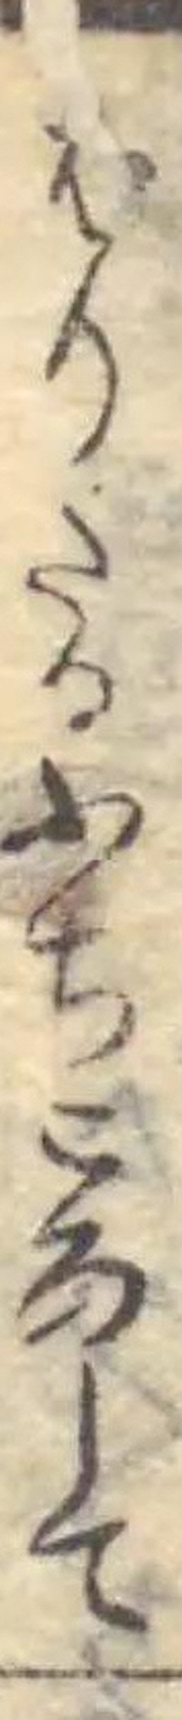ぱりたるふちころして
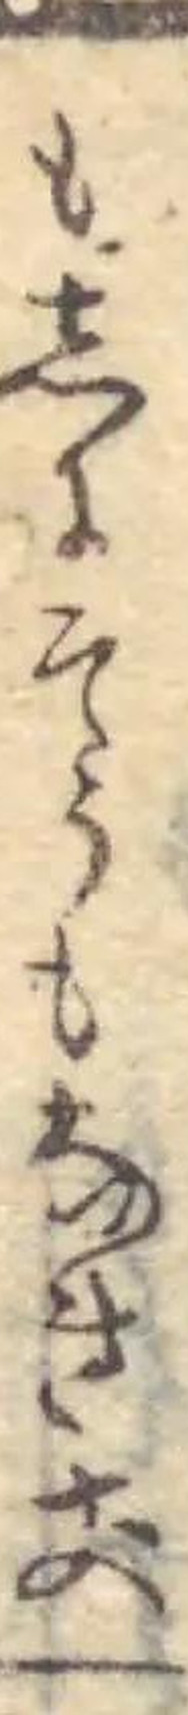もしにそうもなき丈
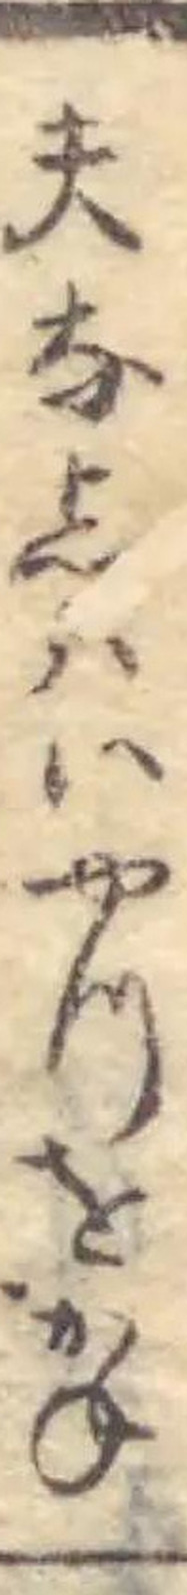夫なしはいやつをかね
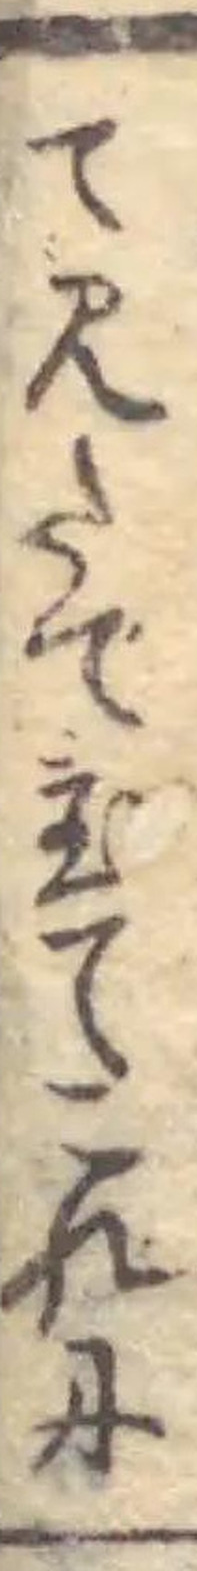て見たて置てこれに
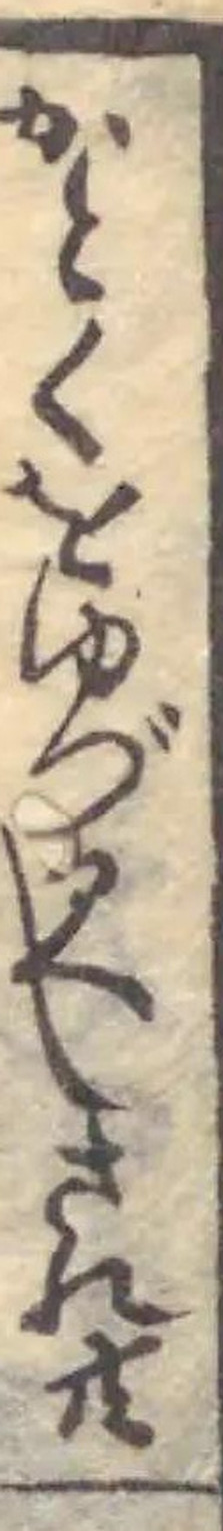かとくをゆづるへしされ共
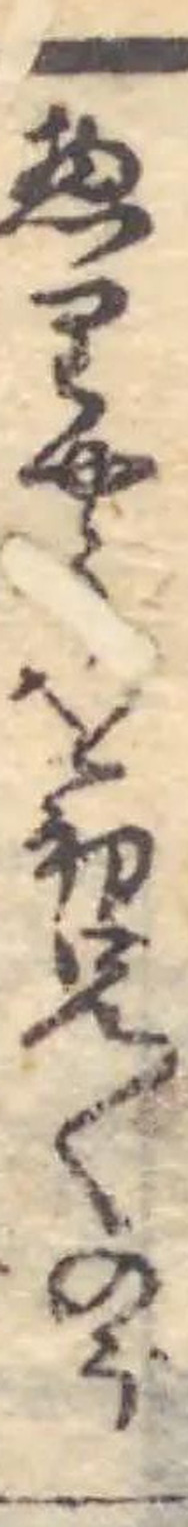惣りやうを初兄〳〵のう
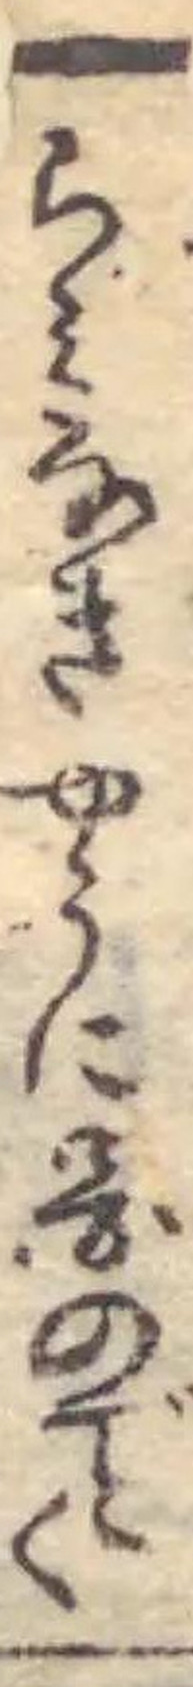らみなきやうに図のごとく
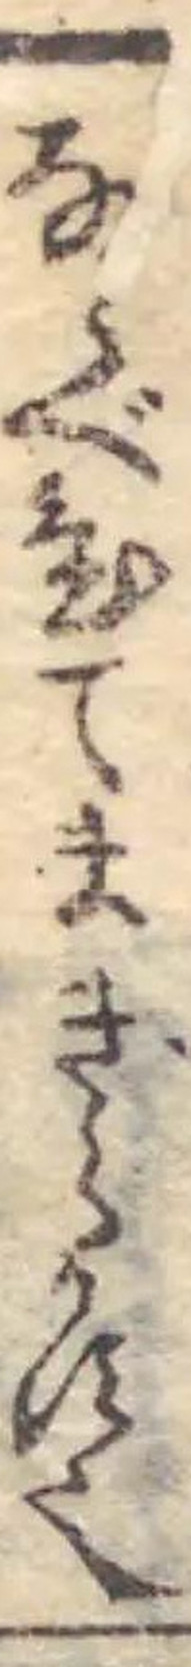ならべ置てまきらかす也
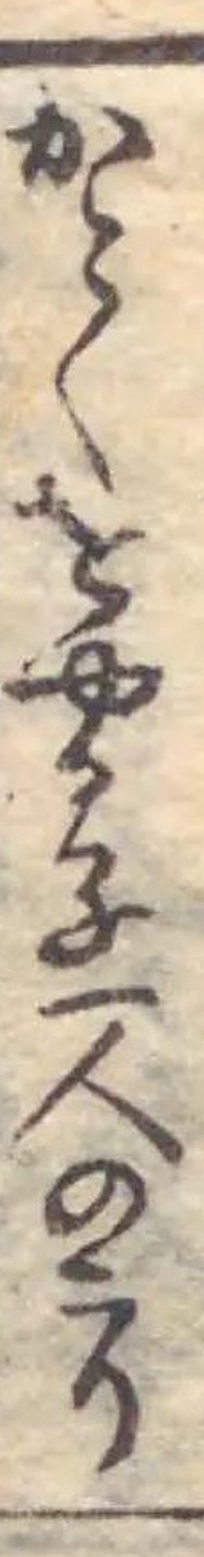かとくをやる子一人のこり
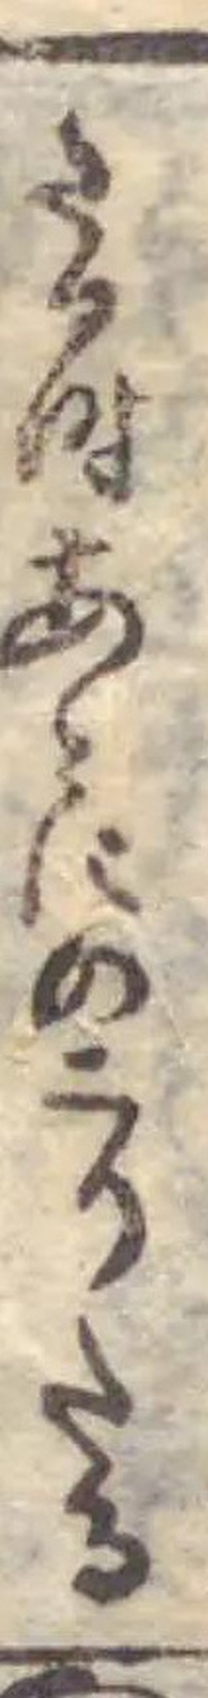たる時あとにのこりたる
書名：大通人好記
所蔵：国立国会図書館 National Diet Library, JAPAN
